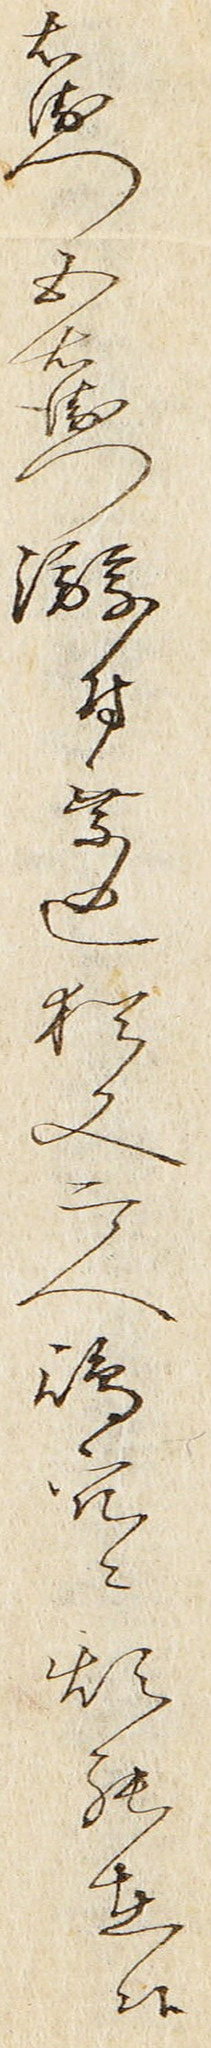右衛門五右衛門游付乗込猶又二人嶋穴に煩罷在候
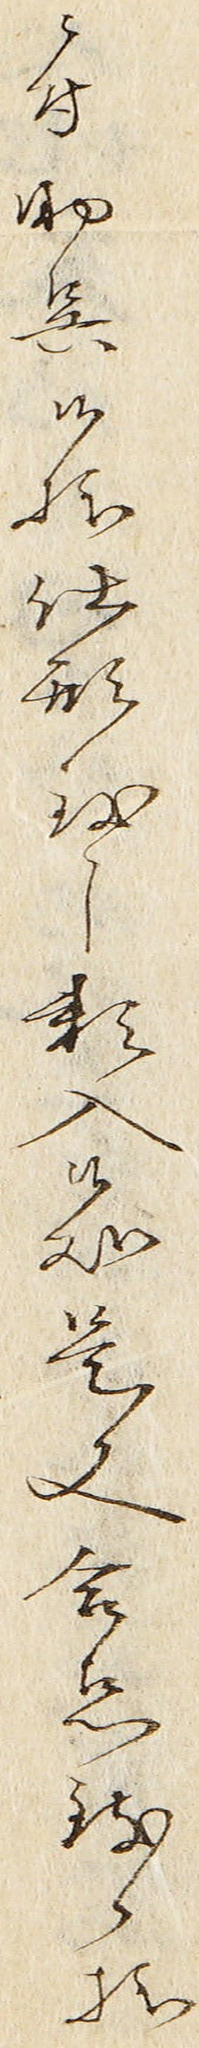に付助呉候様仕形致し頼入候処是又合点致候様
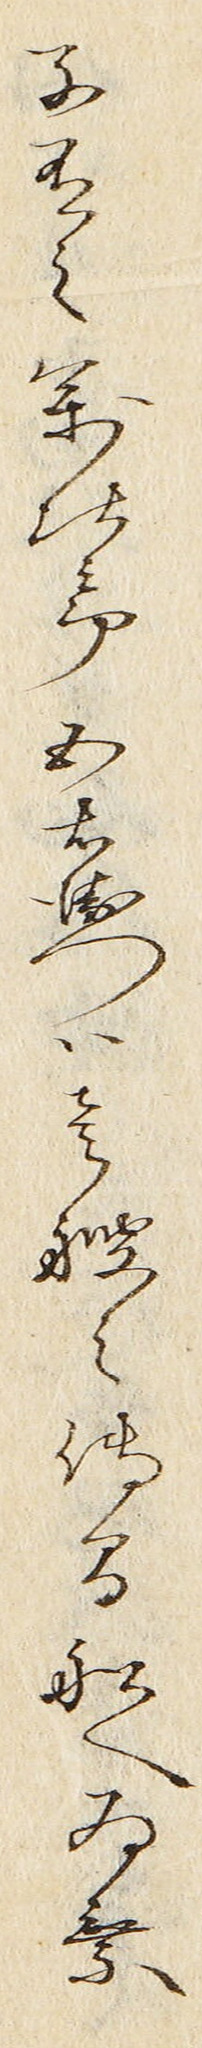に有之万次郎五右衛門は壱艘之伝間船へ為乗
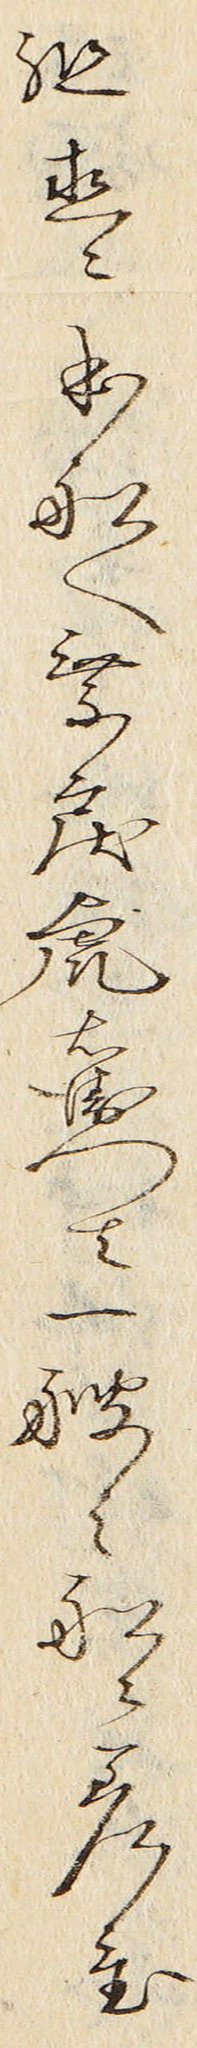組直に本船へ乗戻虎右衛門は一艘之船に差置
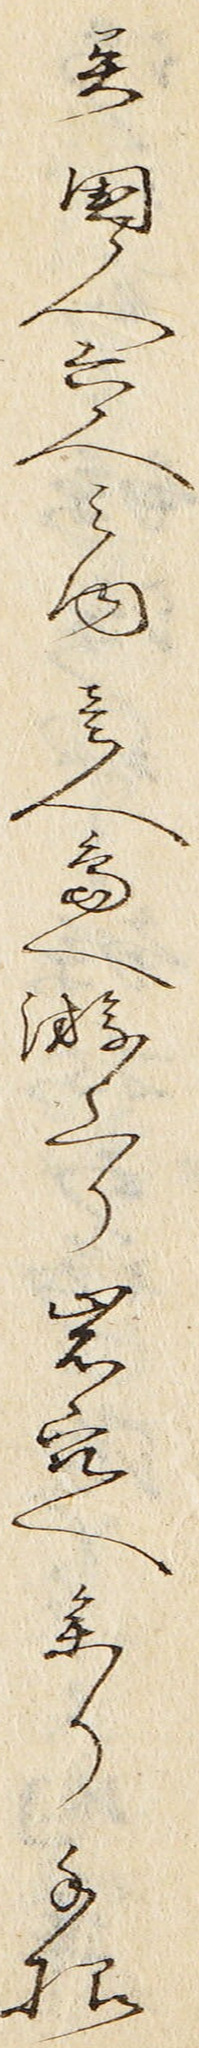異国人六人之内壱人島へ游上り岩穴へ参り手振
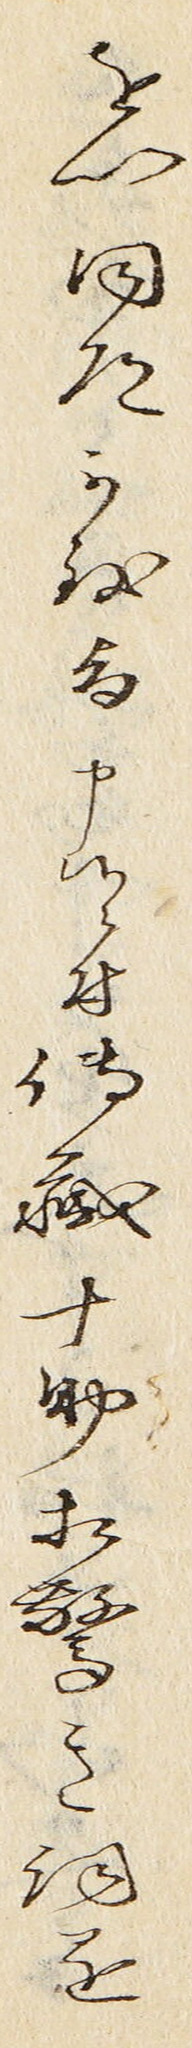を以同道可致旨申候に付伝蔵十助相驚き詞懸
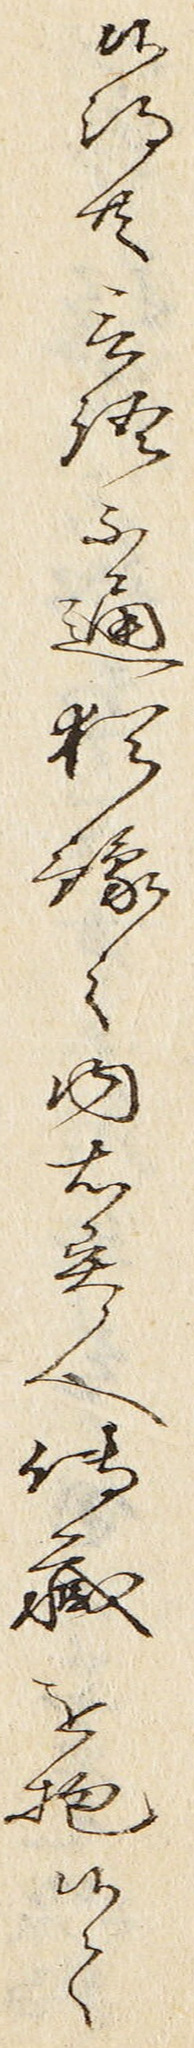候得共言語不通猶予之内右異人伝蔵を抱候て
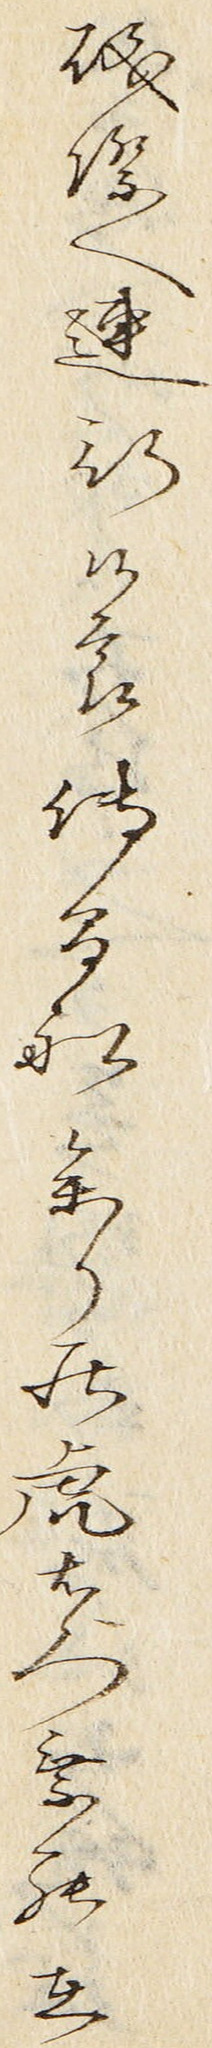礒際へ連行候節伝間船参り居虎右衛門乗罷在
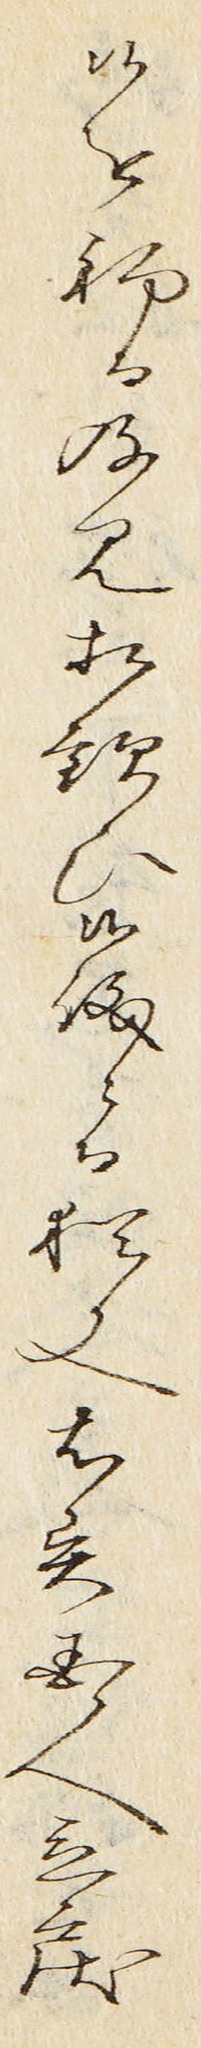候を初而及見相歓ひ候儀に而猶又右異国人立戻
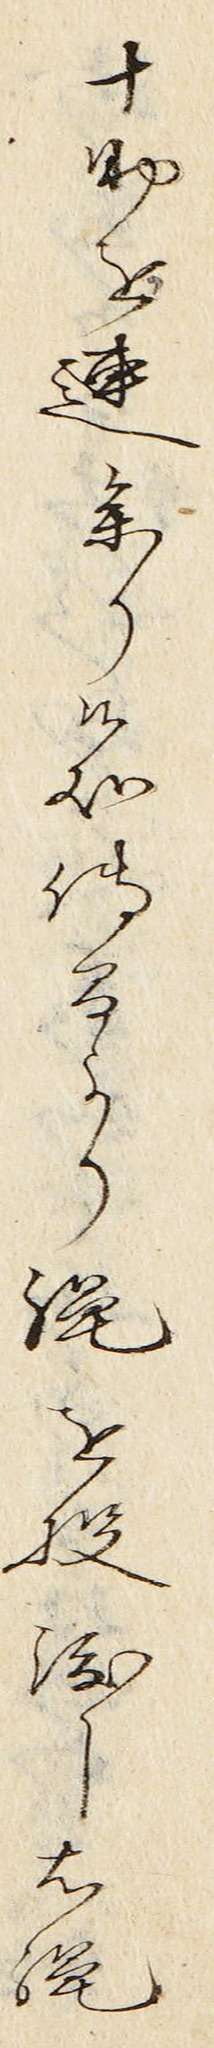十助を連参り候処伝間より縄を投渡し右縄
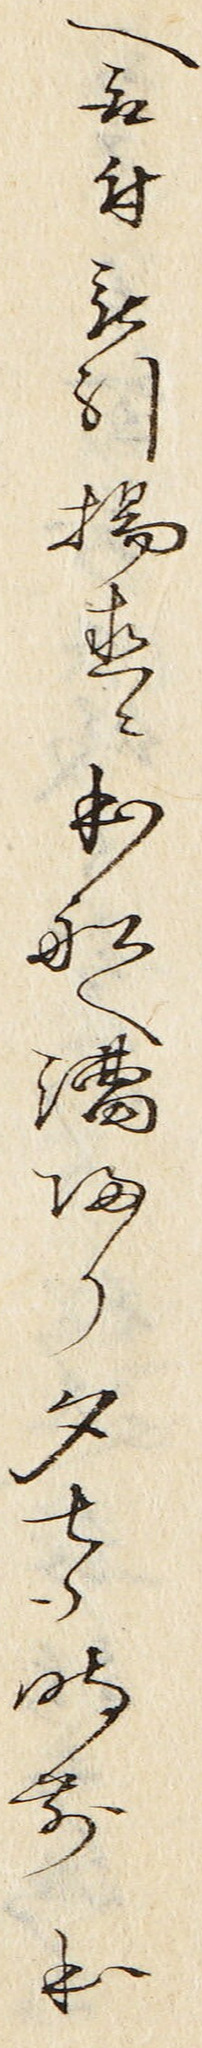へ取付被引揚直に本船へ漕帰り夕七ッ時前本
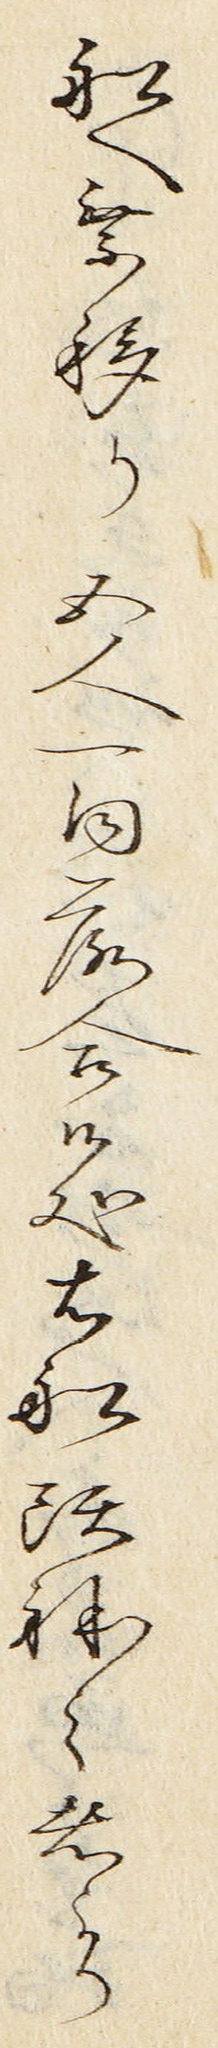船へ乗移り五人一同落合候処右船頭躰之者より
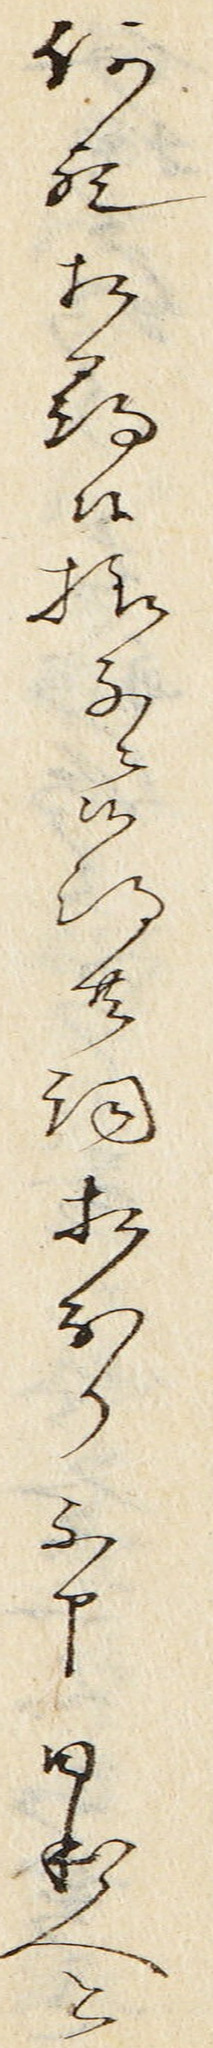何歟相尋候様子に候得共詞相分り不申日本人と
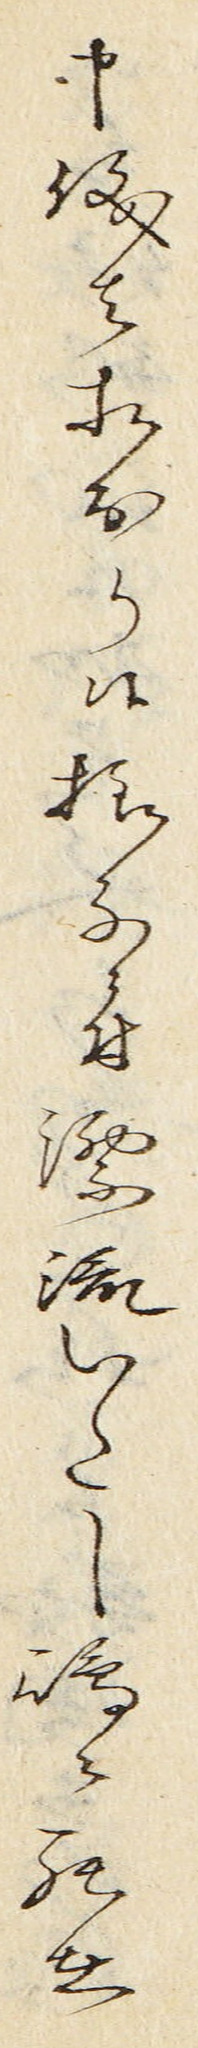申儀は相分り候様子に付漂流いたし嶋に罷在

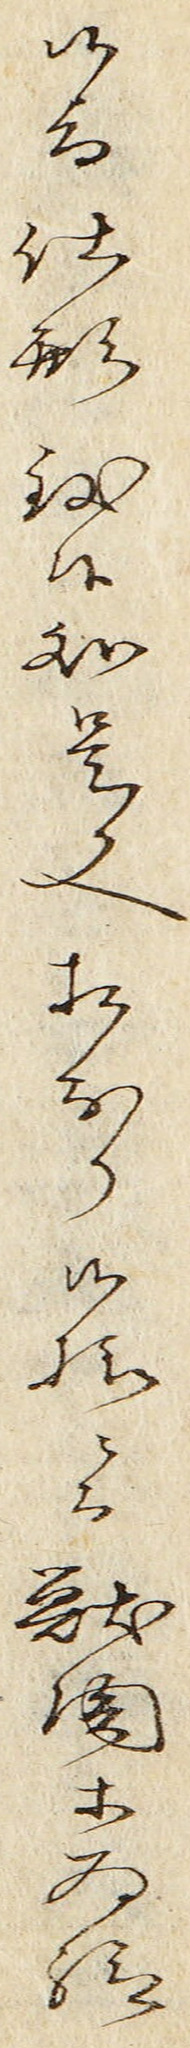候而仕形致候処是又相分り候様に而獣肉等為給
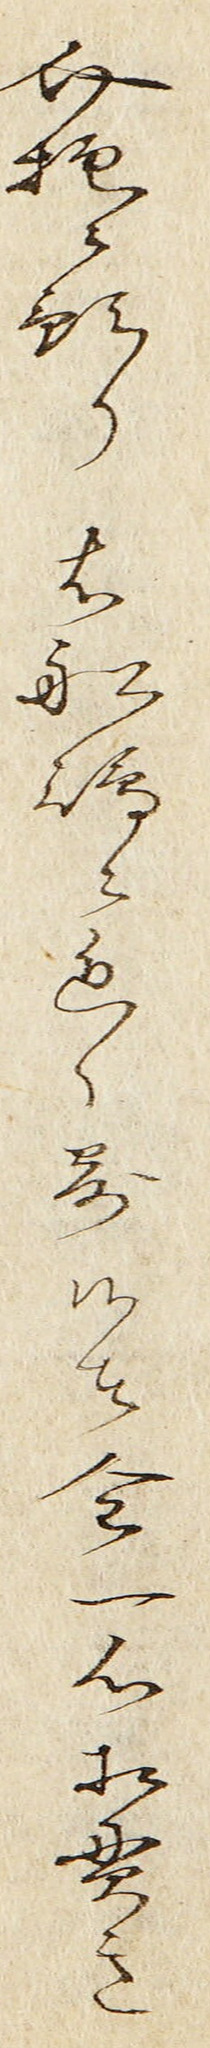介抱に預り右船嶋に近く寄候は全一心相貫き
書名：土佐中浜万次郎漂流記
